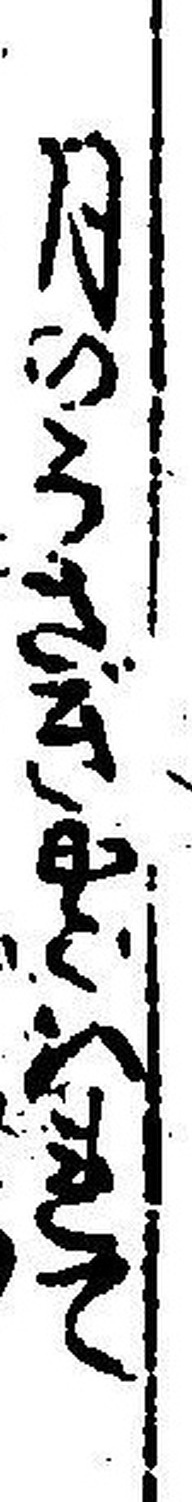月のうさぎやとはれて
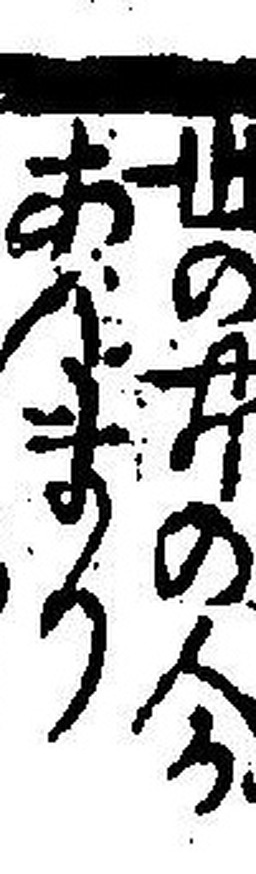あんまり
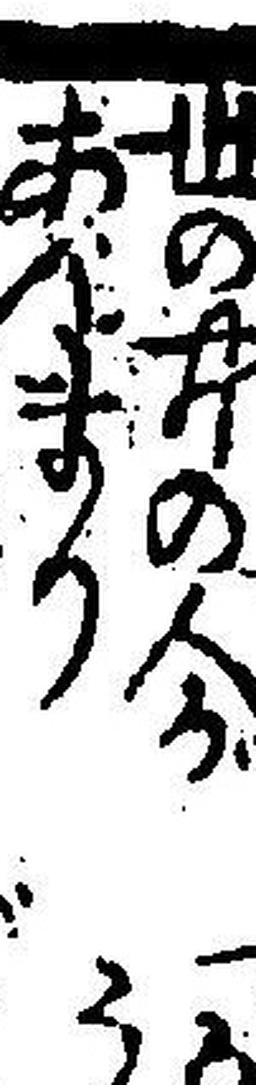あんまり
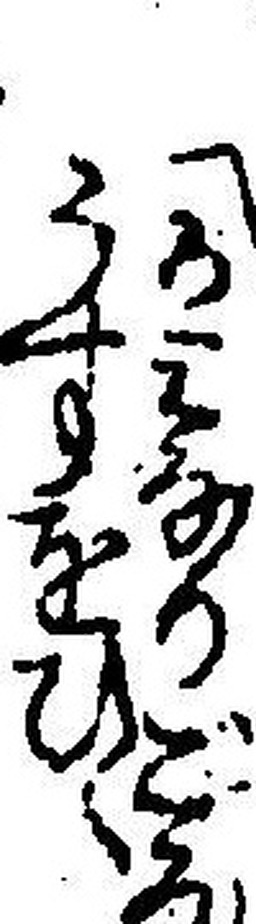うすをひく
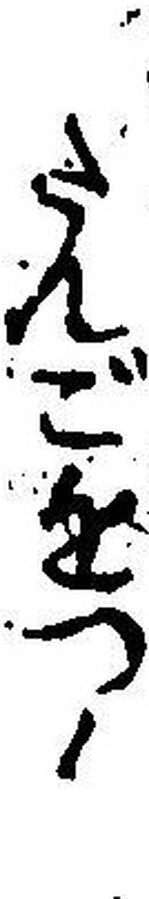たんごをつく
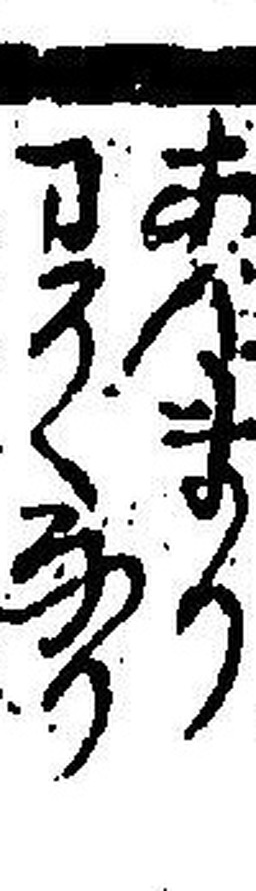わかくなり
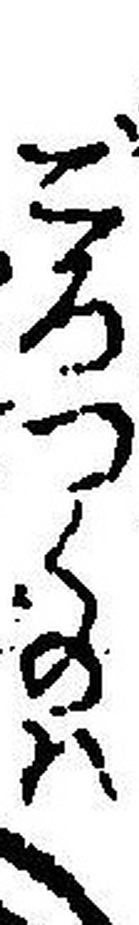ごろつくのは
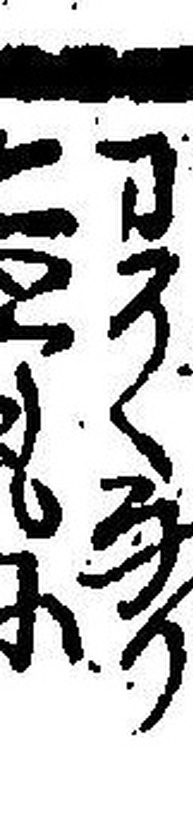こともに
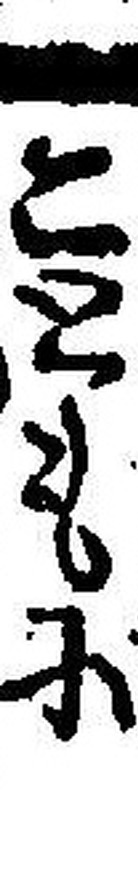こともに
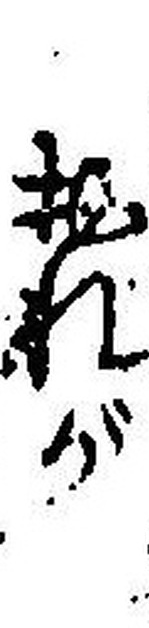おれが
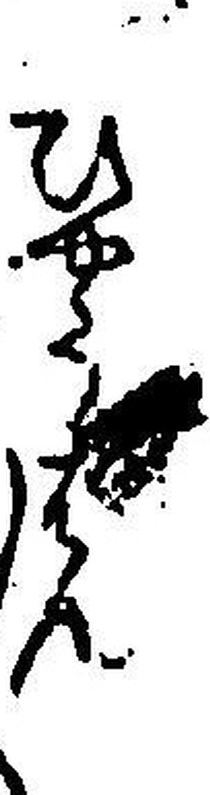ひやうばん
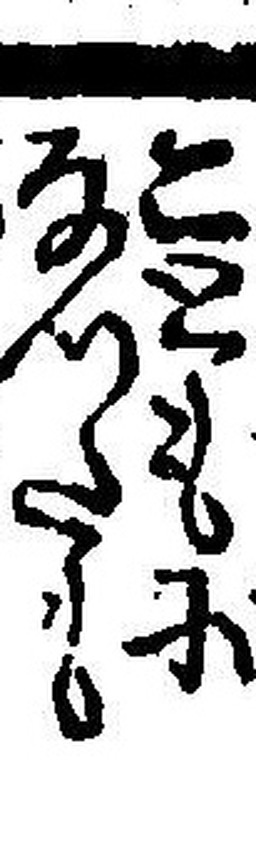なつたも
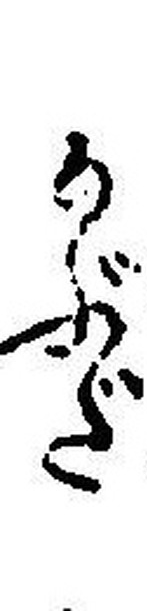かぶだ
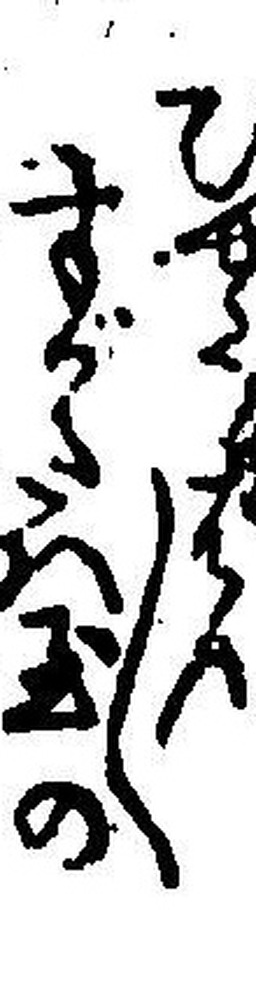すがたは玉の
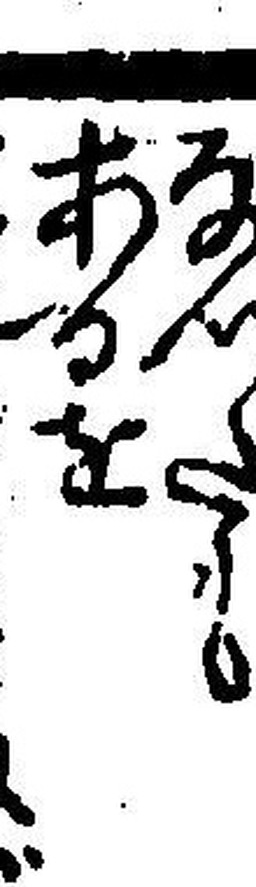あるを
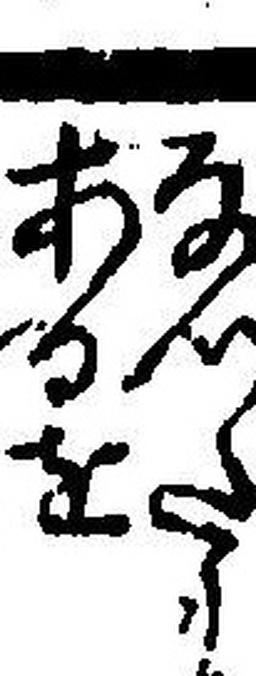あるを
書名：徳若水縁起金性 / 樹下石上作
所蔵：東京大学総合図書館 General Library in the University of Tokyo, JAPAN
